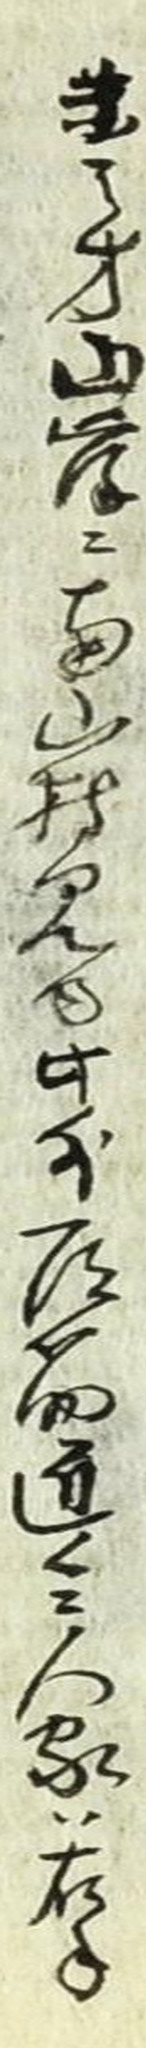未之方山岸に南山村見ゆ此外道筋近くニ人家ハ右手
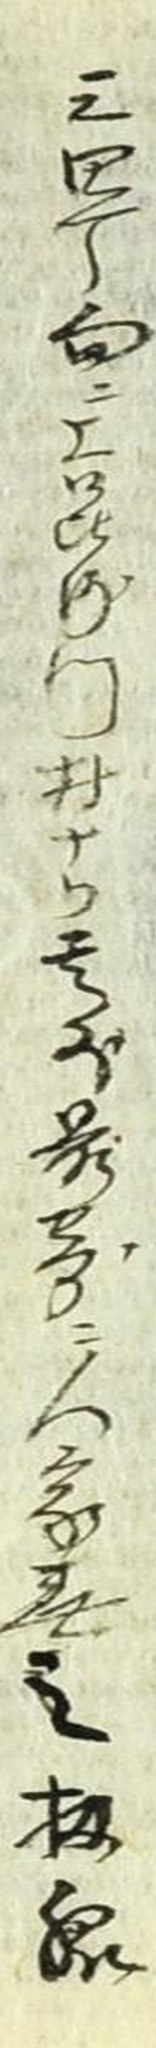三四丁向ニ上毘沙門村ナリ其外最寄ニ人家無之扨脇
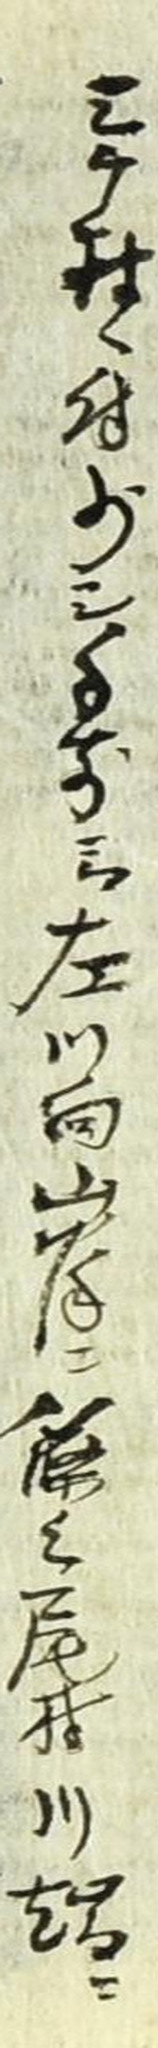三ヶ村へ付少シ手前ニ而左川向山岸に篠之尾村川端ニ
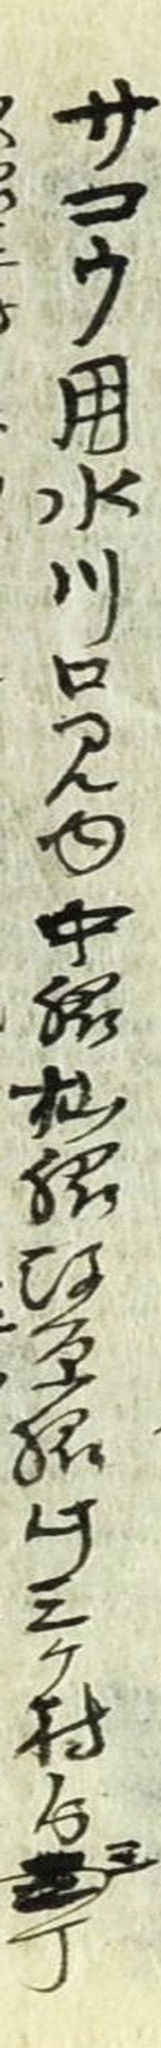サコウ用水川口見ゆ中脇杣脇河原脇此三ヶ村ゟ三丁
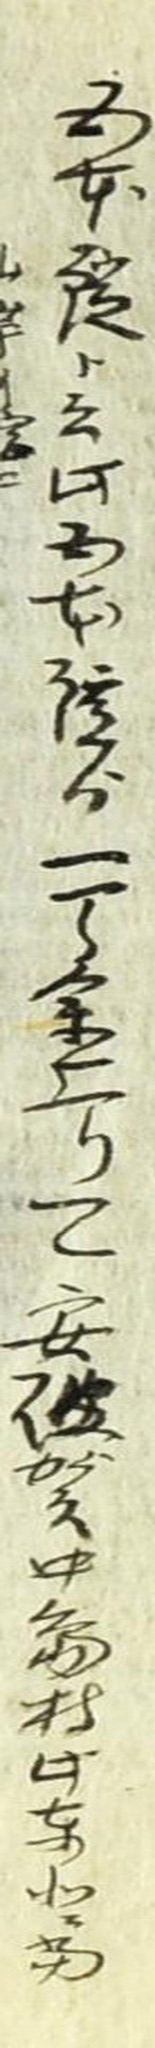五本錠と云此五本錠ゟ一丁余上りて安破賀中島村此東北に当
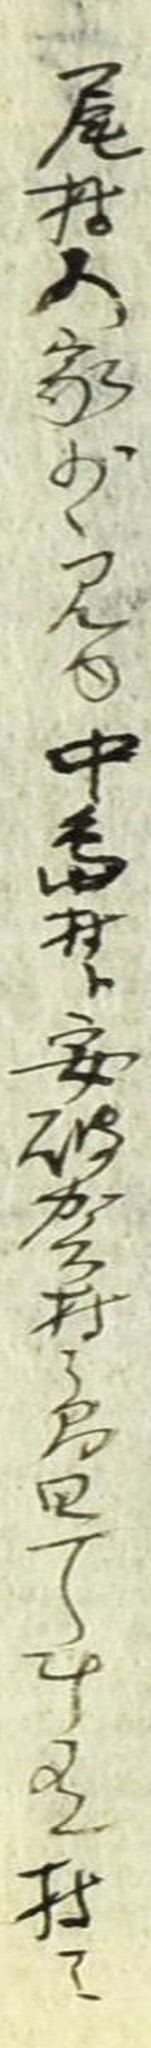尾村人家少々見ゆ中島村ト安破賀村之間四丁計有村之
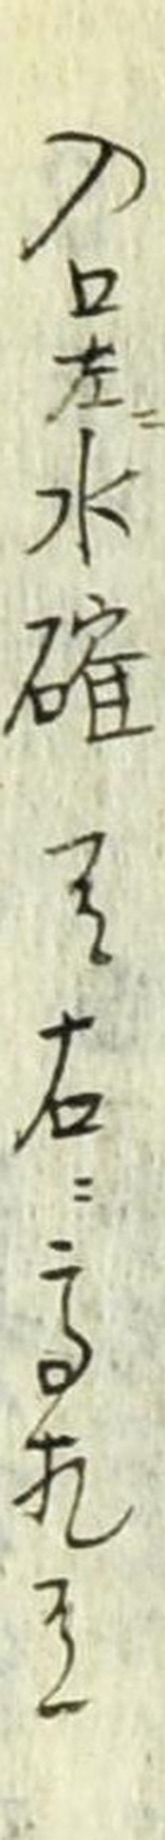入口左ニ水碓有右に高札有
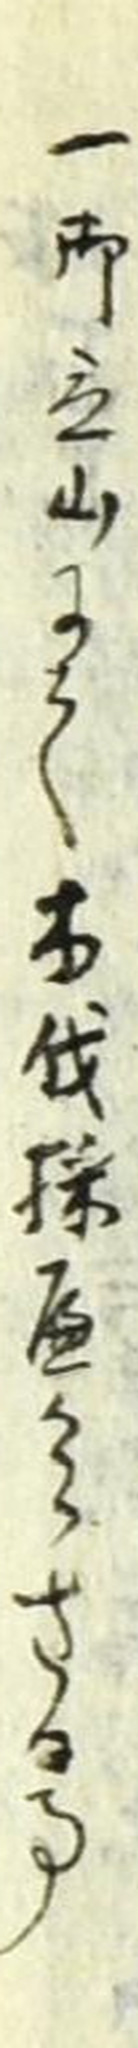一御立山にて木伐採へからさる事
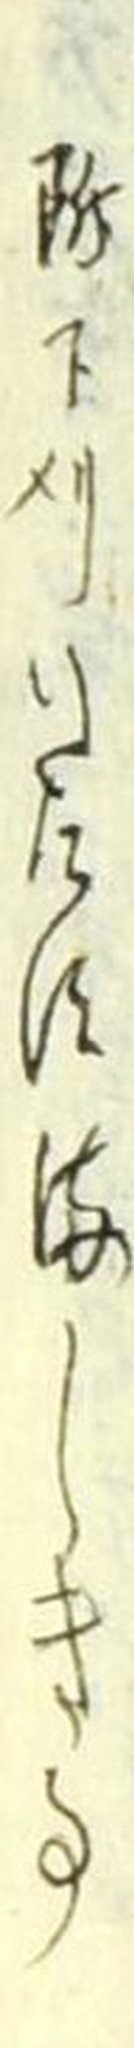附下刈いたすましき事

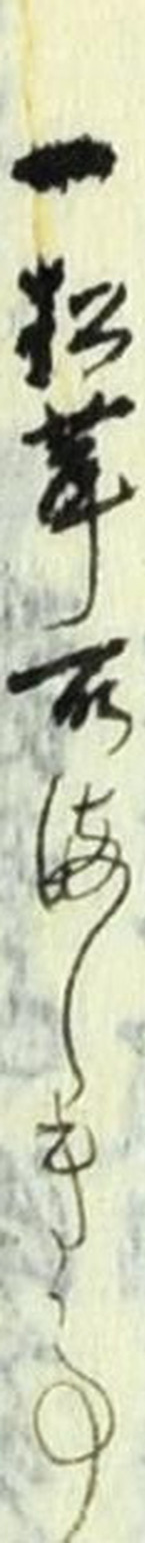一松茸取ましき事
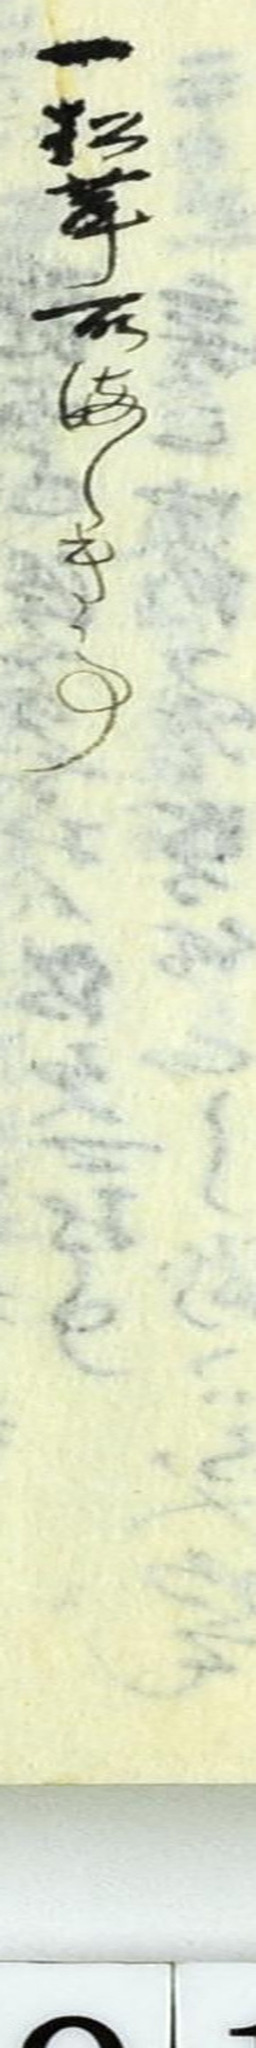一松茸取ましき事
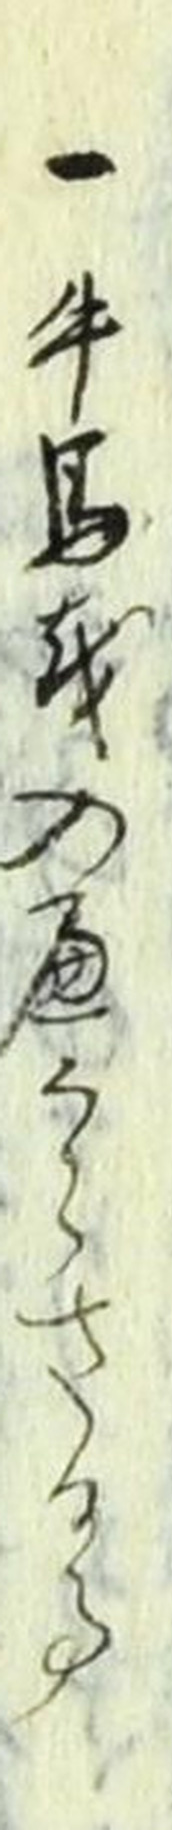一牛馬を入へからさる事
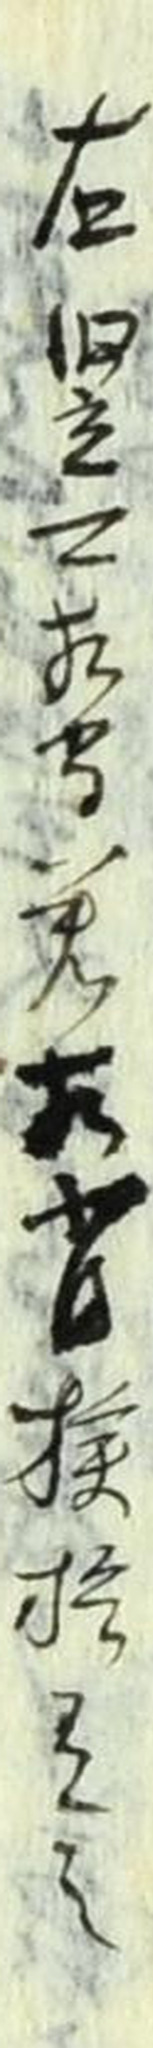右堅可相守若相背族於有之
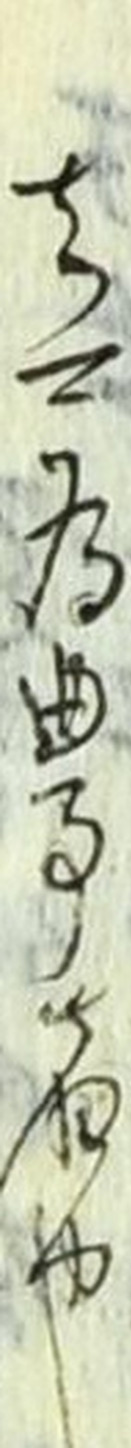者可為曲事者也
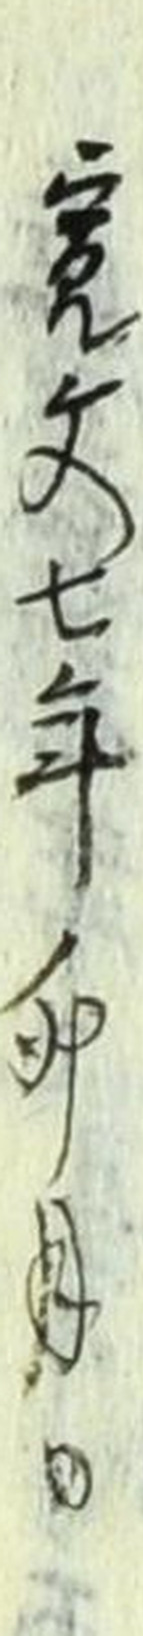寛文七年卯月日
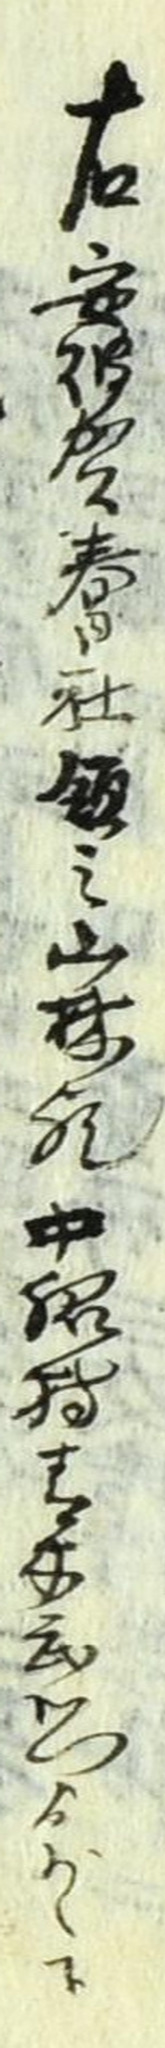右安破賀春日社領之山林歟中脇村青木武右衛門ゟ少し下
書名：（日記）
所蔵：福井県文書館 Fukui Prefectural Archives
